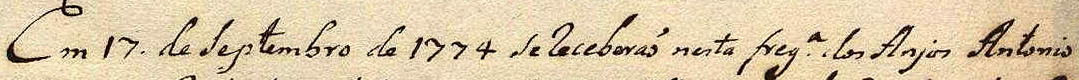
Em 17. de Septembro de 1774 se Receberaõ nesta freg.a dos Anjos Antonio
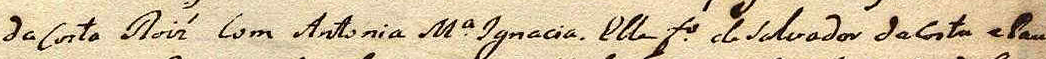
da Costa Roiz̄ Com Antonia M.a Ignacia. Elle f.o de Salvador da Costa e Pau
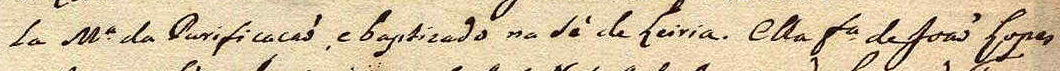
La M.a da Purificaçaõ, e baptizado na Sé de Leiria. ella f.a de Joaõ Lopes
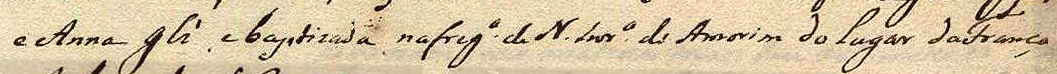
e Anna glz, e baptizada na freg.a de N. snr.a de Amorim do Lugar da França
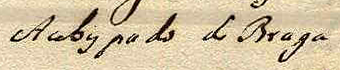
Acebispado do Braga
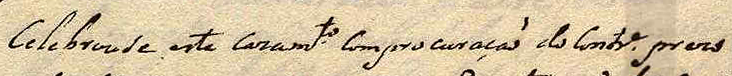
Celebrouse este cazam.to com procuraçaõ do contr.e prezo
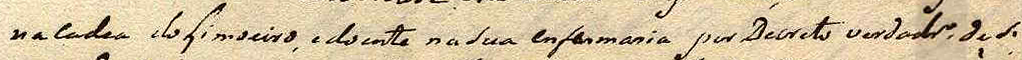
na cadea do Limoeiro, e doente na sua enfermaria por Decreto verdadro, de s.
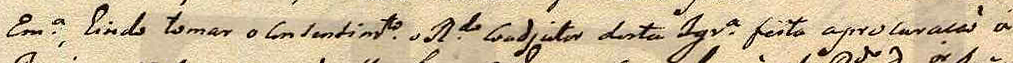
Em.a, hindo tomar o consentim.to. o R.do Coadjutor deste Igr.a feita a procuraçaõ a
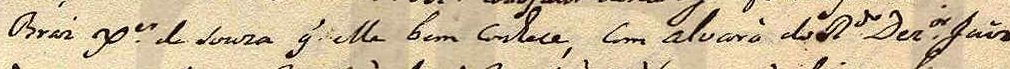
Braz X.er de Souza q̄ elle bem conhece, com alvaro do R.do Dez.or Juis
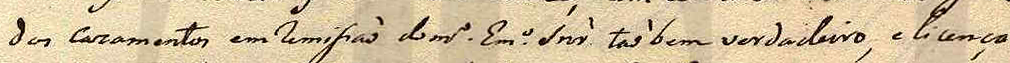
dos cazamentos em Remissaõ do m.o. Em.o snr̄ taõbem verdadeiro, e licença
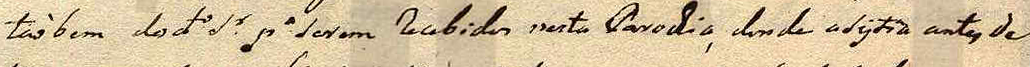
taõbem do d̄.o S.r p.a serem Recebidos nesta Parochia, donde asistia antes de
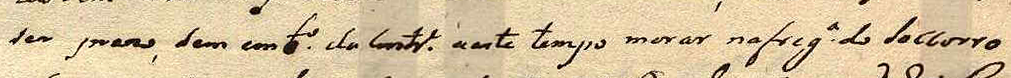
ser prezo, sem cont.o. da contr.e neste tempo morar na freg.a do Soccorro
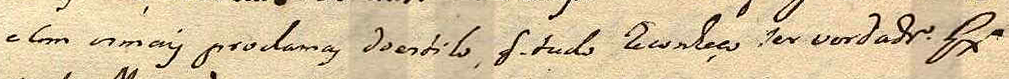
e Com os mais proclamas do estilo, q̄ tudo Reconheço ser verdadr.o Lx.a
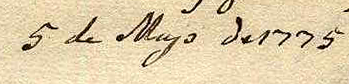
5 de Majo de 1775
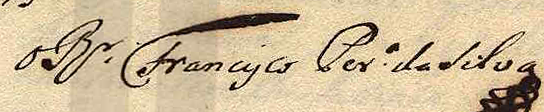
o R. Francisco Per.a da Silva
